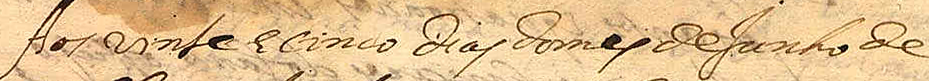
Aos vinte E cinco dias do mes de Junho de
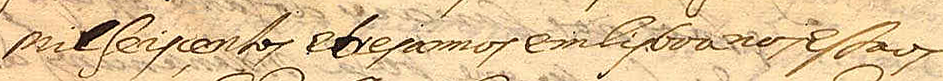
mil E seisçentos E tres annos em lisboa nos Estaos
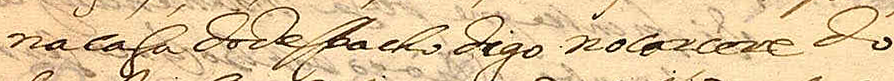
na casa do despacho digo no carçere do
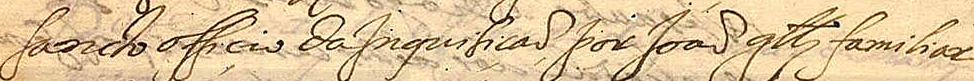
Sancto offiçio da Jnquisiçaõ por Joaõ gl̄lz familiar
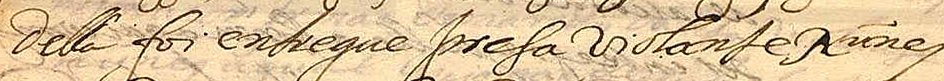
della foi entregue presa Violante Nun̄ez
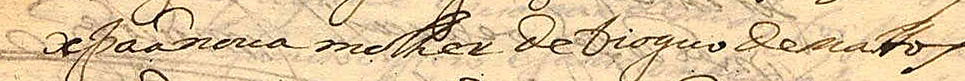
xpaā noua molher de Dioguo de mattos
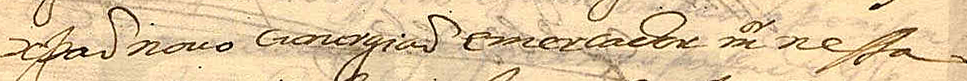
xpaõ nouo cirurgiaõ E mercador mor nesta
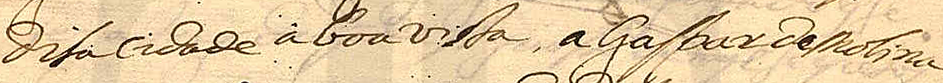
dita cidade â boa vista, a Gaspar de Molina
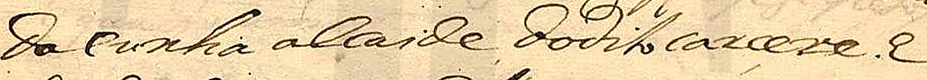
da cunha alcaide do dito carçere. E
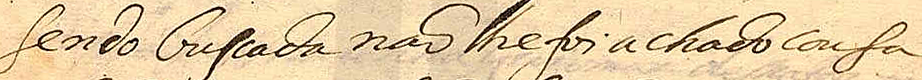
sendo buscada naõ lhe foi achado cousa
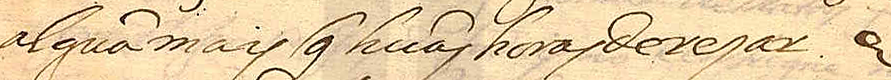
alguā mais q̄ huās horas de rezar. E
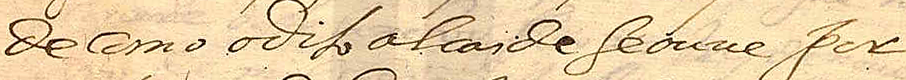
de como o dito alcaide se ouue por
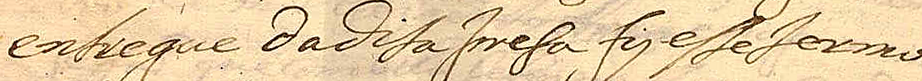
entregue da dita presa fiz elle termo
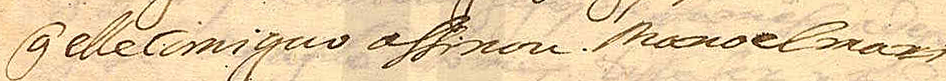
q̄ elle comiguo assinou. Manoel mari
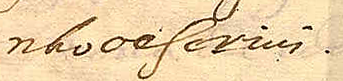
nho o escriui.
